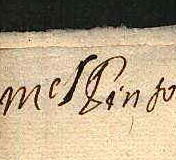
mel Pinto
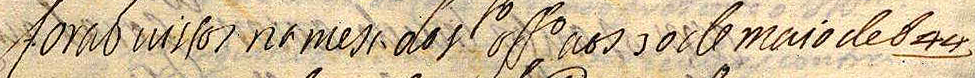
foraõ uistos na mesa do sto offo aos 30 de maio de 644
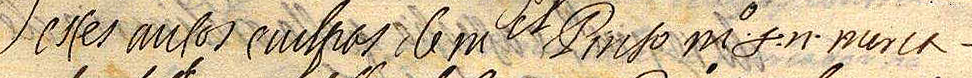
estes autos e culpas de mel Pinto mo x.n. merca
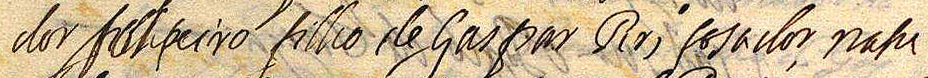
dor Solteiro filho de Gaspar Rrs tosador, natu
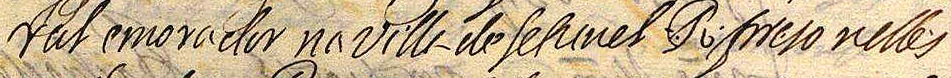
ral e morador na villa de Setuuel R. preso nelles
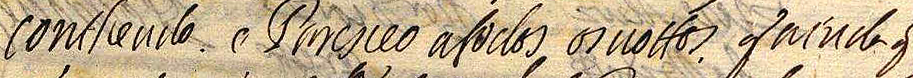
contheudo. e Paresceo a todos os uottos. q̄ ainda q̄
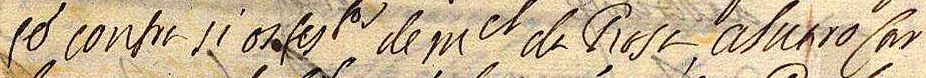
tē contra si os testos de mel da Rosa, aluaro Car
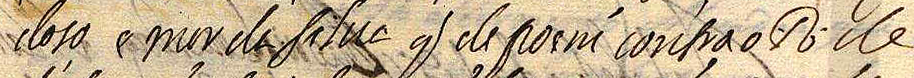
doso, e mor da silua q̄ depoem contra o R. de
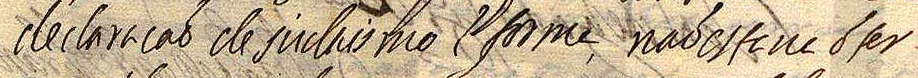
declaraçaõ de judaismo ē forma, naõ estaua ē ter
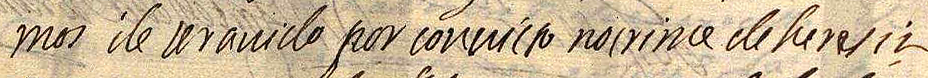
mos de ser auido por conuicto no crime de heresia
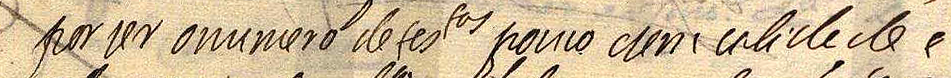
por ser o numero de testas pouco e sem calidade, e
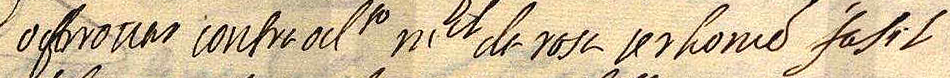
o prouar contra o dto mel da rosa ser homē fasil
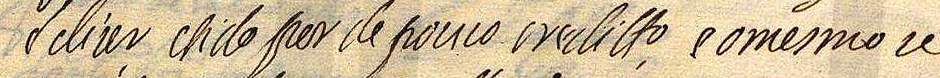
ē dizer, e tido per de pouco creditto, e o mesmo se
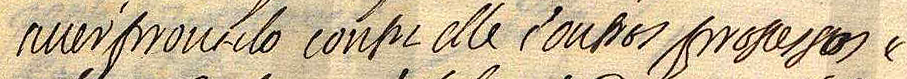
auer prouado contra elle ē outros prossessos, e
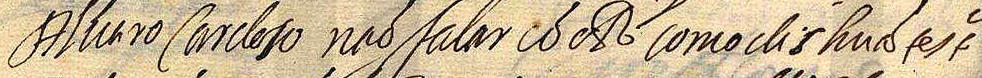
Aluaro Cardoso naõ falar cō o R como dis huā testa
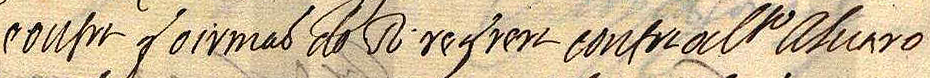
e outra q̄ o irmaõ do R. req̄rera contra o dto Aluaro
